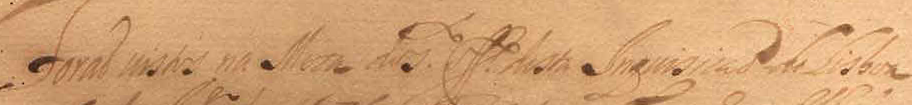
Foraõ uistos na Meza do s.to off.o desta Inquisiçaõ de Lisboa
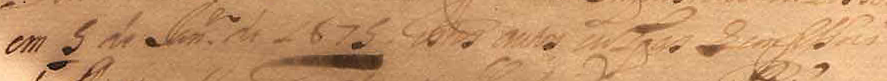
em 5 de Ianro de 1675 estes autos culpas E confissaõ
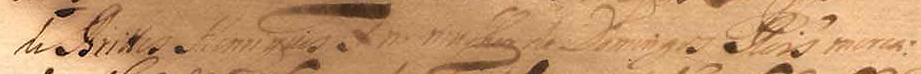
de Brittes Henriques xn. mulher de Domingos Rois̄ merca
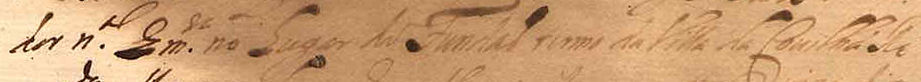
dor n.al E mra no lugar do Fundaõ termo da Villa da Couilhã Ré
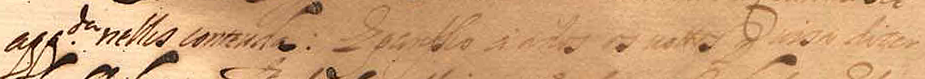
app.da nelles conteuda: E paresseo a todos os uottos q̄ uisto dizer
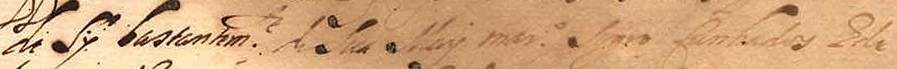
de sy bastantem.te de sua May mar.o sogro Cunhados E de
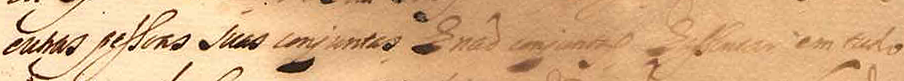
outras pessoas suas conjuntas, E naõ conjuntas, E assentar em tudo
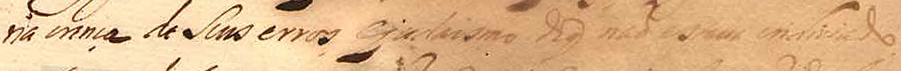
na crença de seus erros, e judaismo de q̄ naõ estaua indisiado
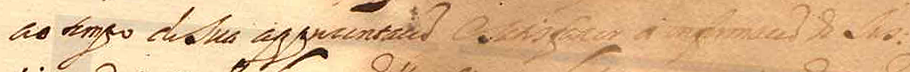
ao tempo de sua apprezentaçaõ e satisfazer a informaçaõ de Ius
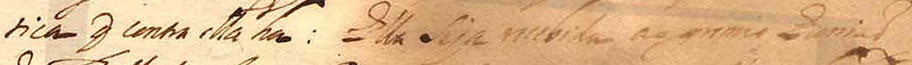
tiça q̄ contra ella ha: Ella seja recebida ao gremio E uniaõ
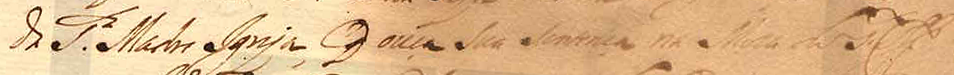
da S.ta Madre Igreja, q̄ ouça sua sentença na Meza do sto offo
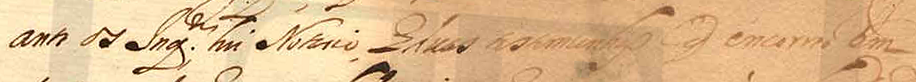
ante os Inq.res, hū Notario, E duas testemunhas q̄ encorreo em
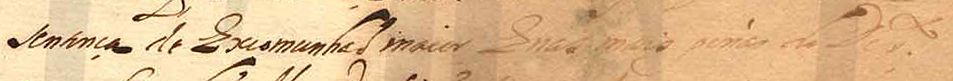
sentença de Excomunhaõ maior E nas mais pen̄as de Dir.to
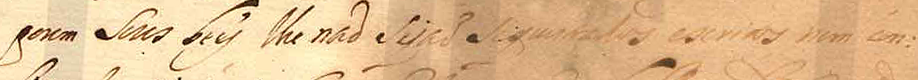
porem seus beēs lhe naõ sejaõ sequestrados escritos nem con
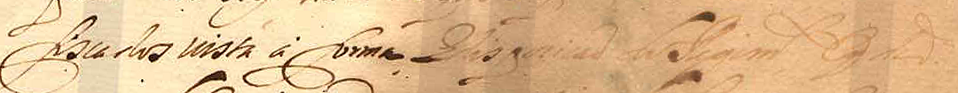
fiscados uista a forma, E dispoziçaõ do Regimto, q̄ da d.a
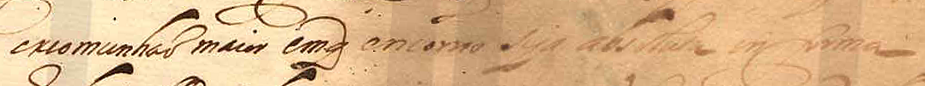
excomunhaõ maior em q̄ encorreo seja absoluta em forma
